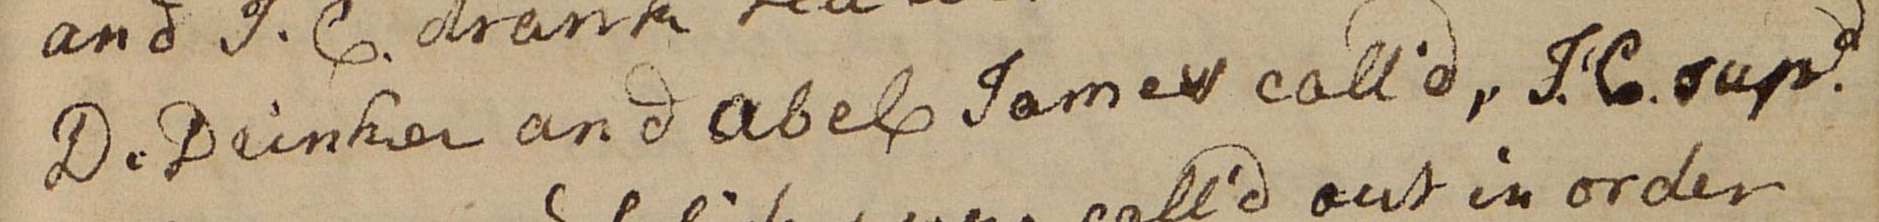D. Drinker and Abel James call'd, I. C. sup^d.
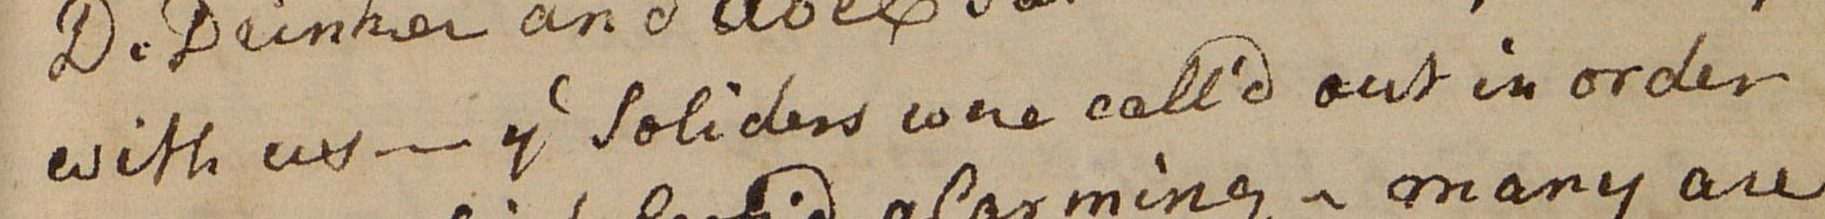with us- y^e Soliders were call'd out in order
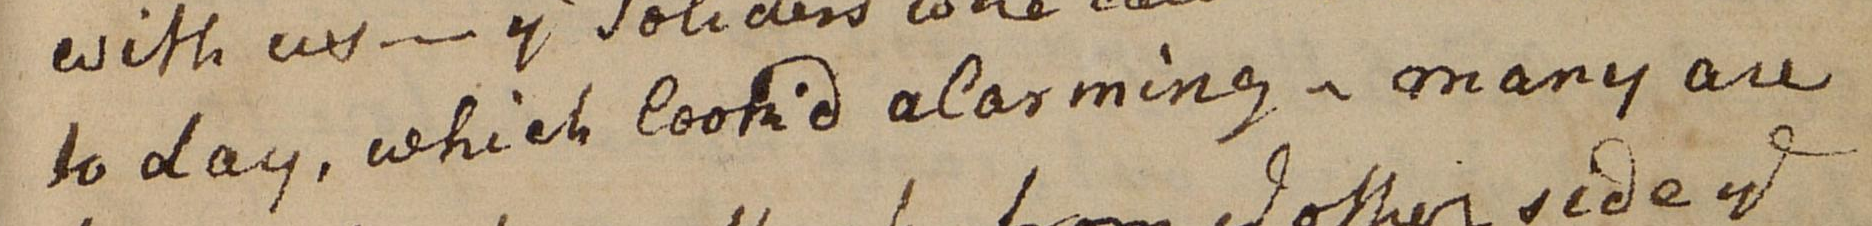to day, which look'd alarming- many are
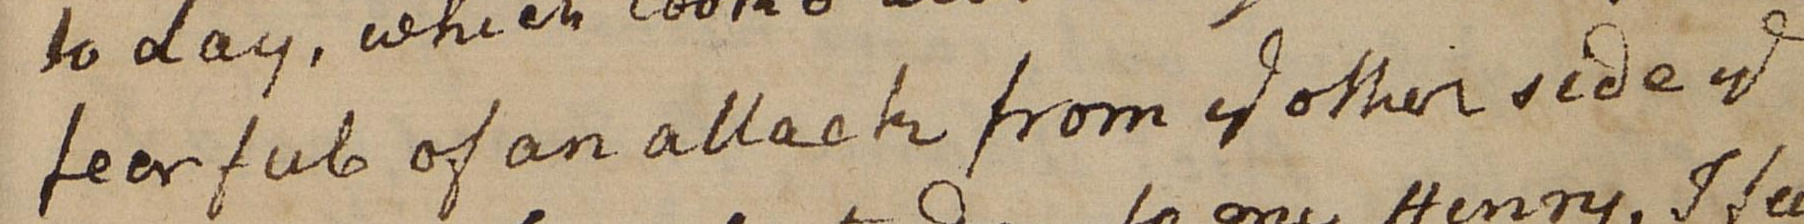feerful of an attack from y^e other side y^e
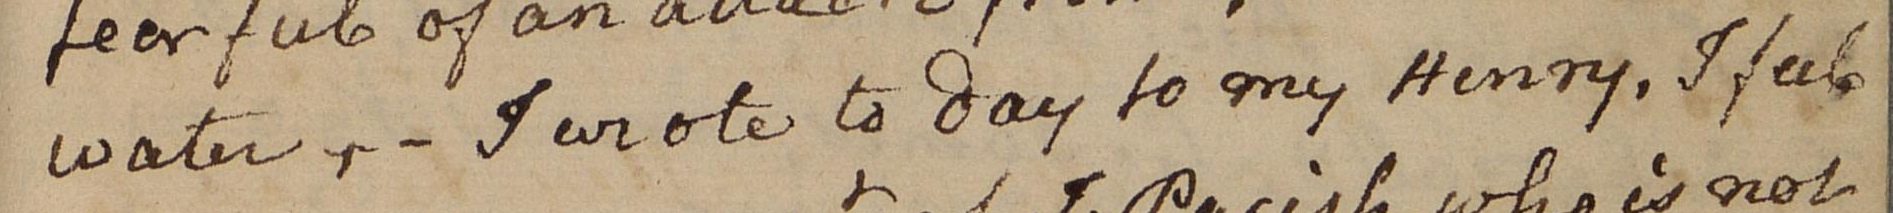water-- I wrote to day to my Henry, I feel
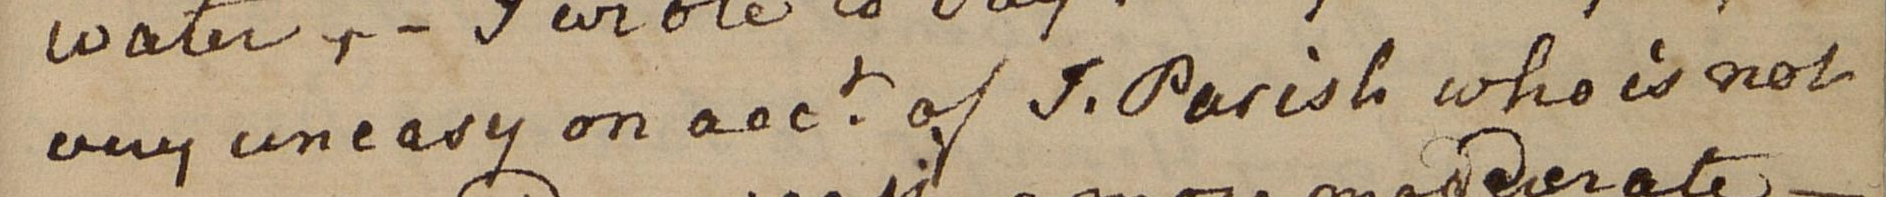very uneasy on acc^t. of I. Parish who is not
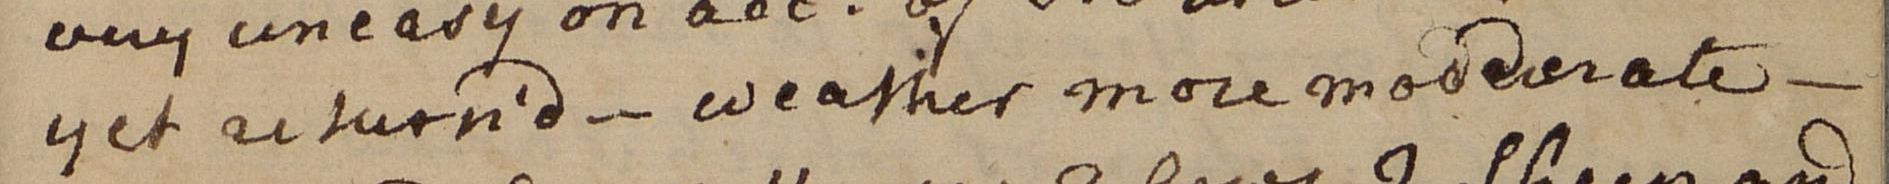yet return'd- weather more modderate-
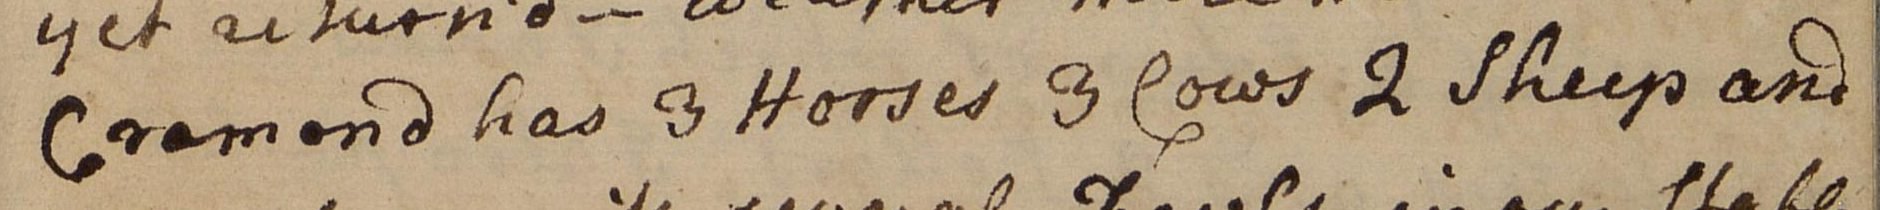Cramond has 3 Horses 3 Cows 2 Sheep and
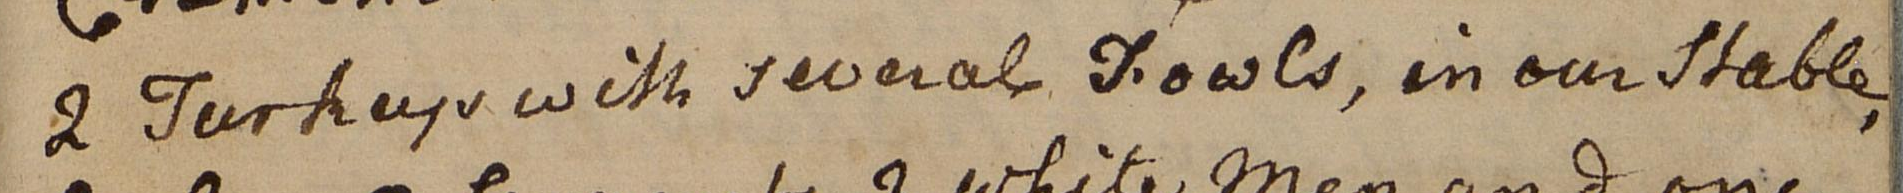2 Turkeys with several Fowls, in our Stable,
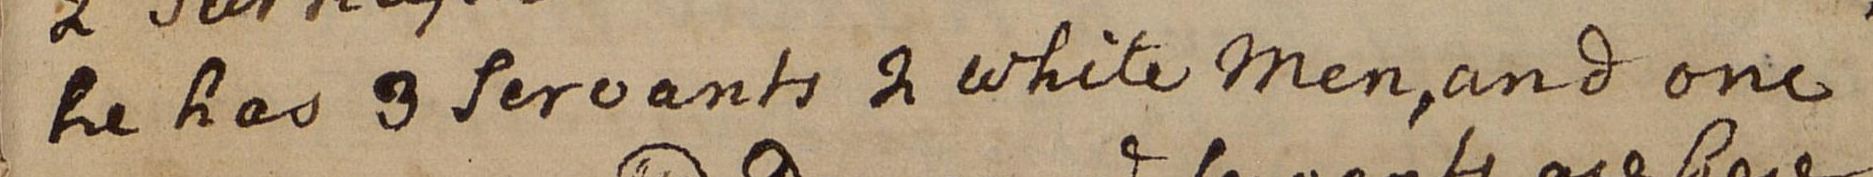he has 3 Servants 2 White Men, and one
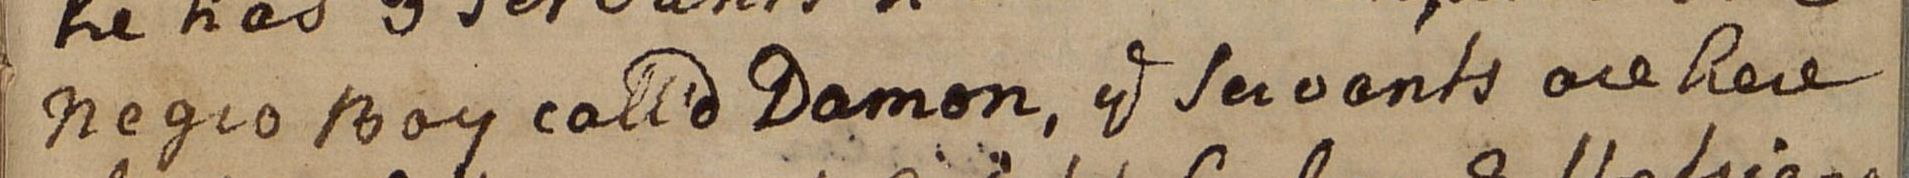Negro Boy call'd Damon, y^e servants are here
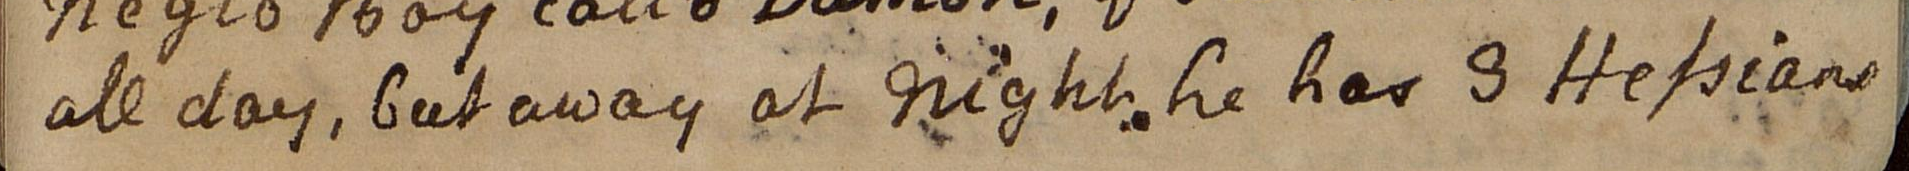all day, but away at Night he has 3 Hessians
